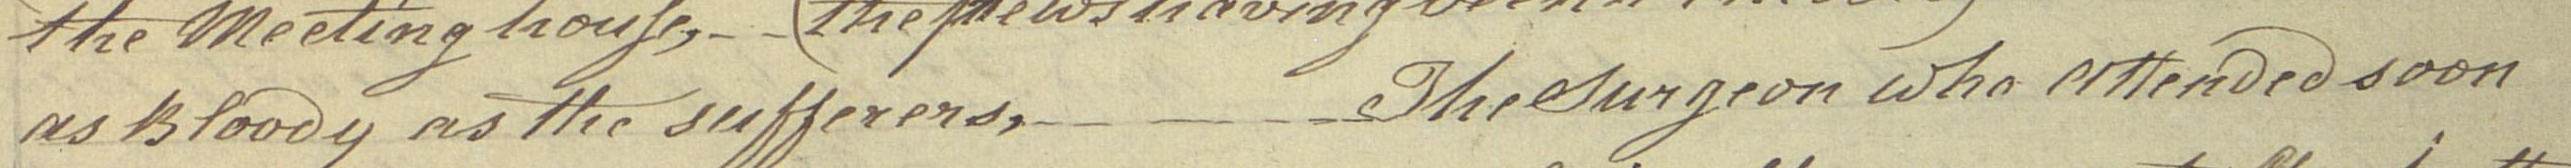as Bloody as the sufferers. The Surgeon who attended soon
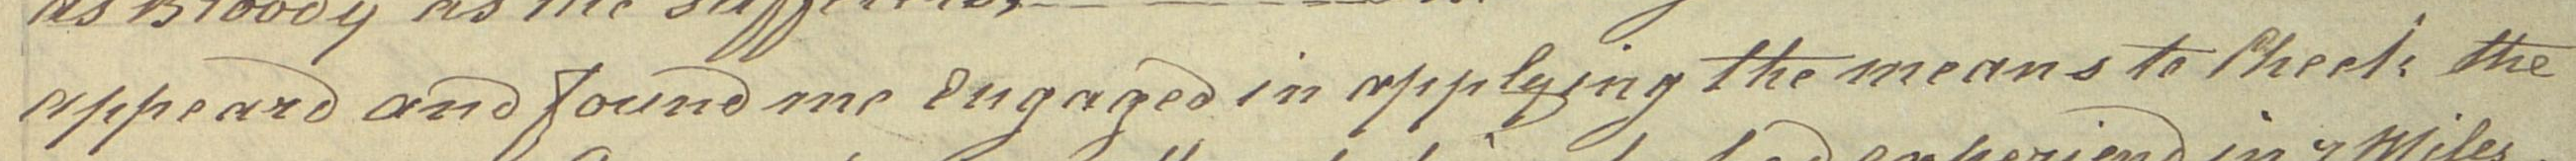appeard and found me engaged in applying the means to check the
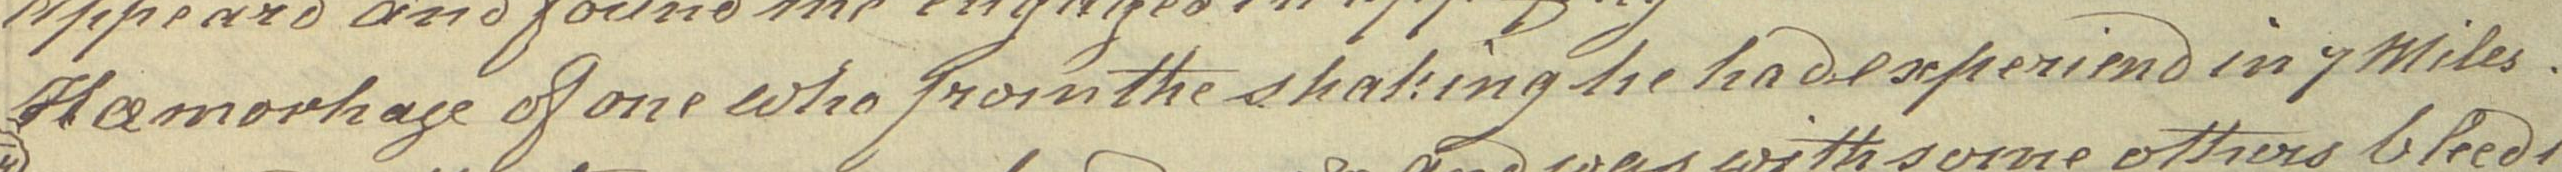Hamorhage of one who from the shaking he had experiend in 7 Miles
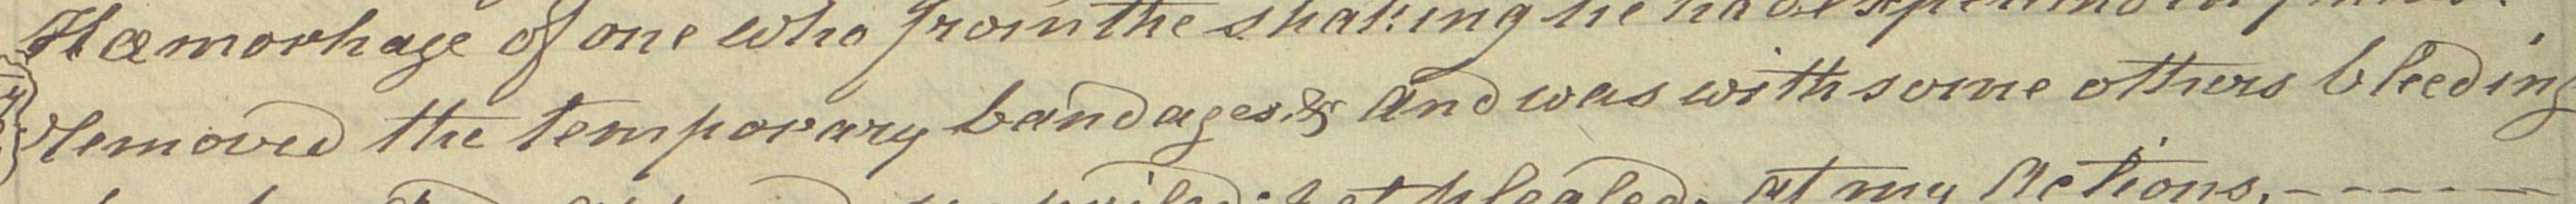removed the temporary bandages &c And was with some others bleeding
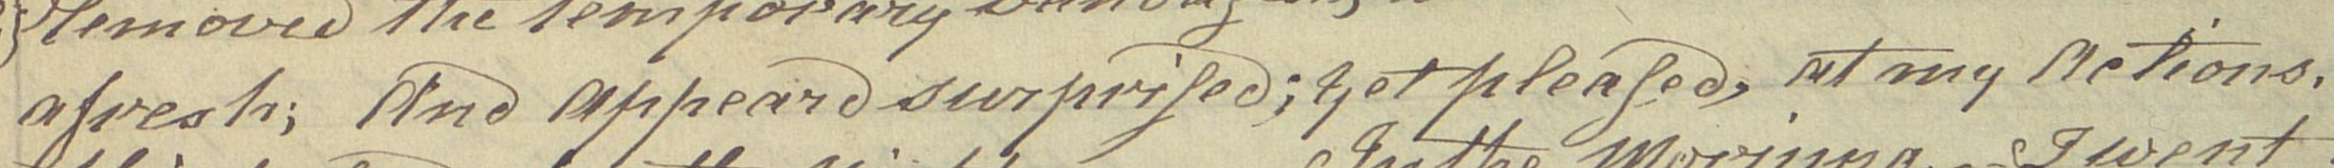afresh; And appeard surprised; yet pleased at my Actions,
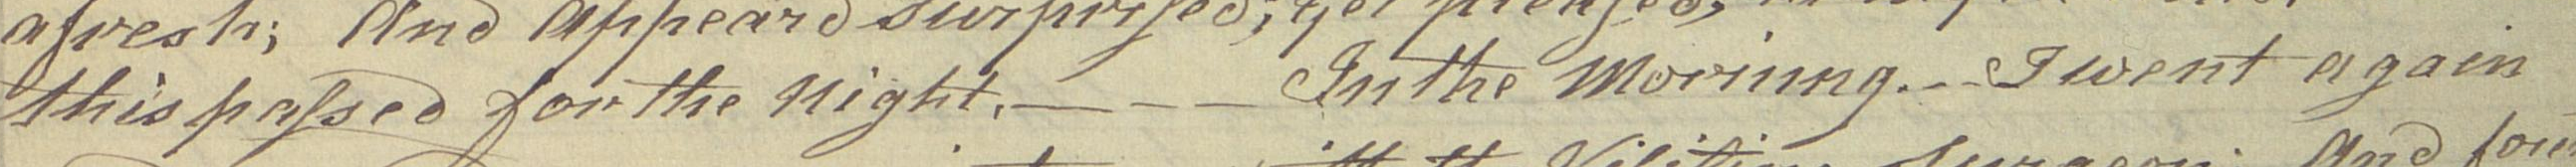this passed for the night. In the Morning, I went again
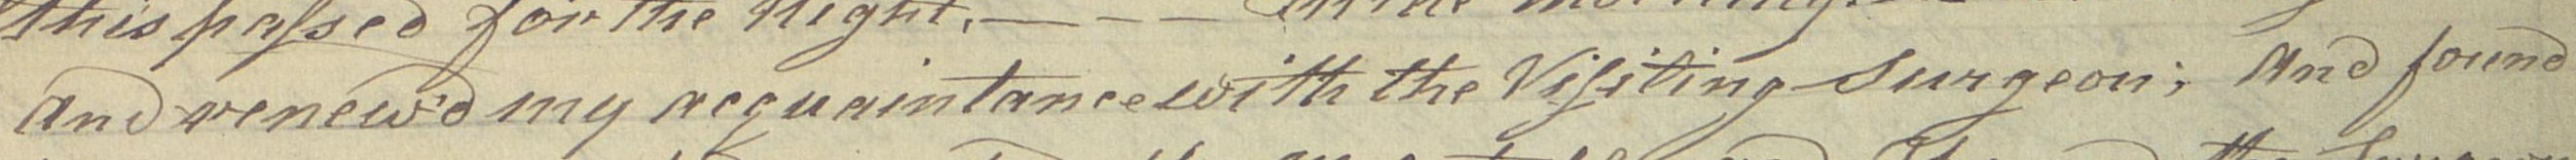and renew'd my acquaintance with the Visiting surgeon; And found
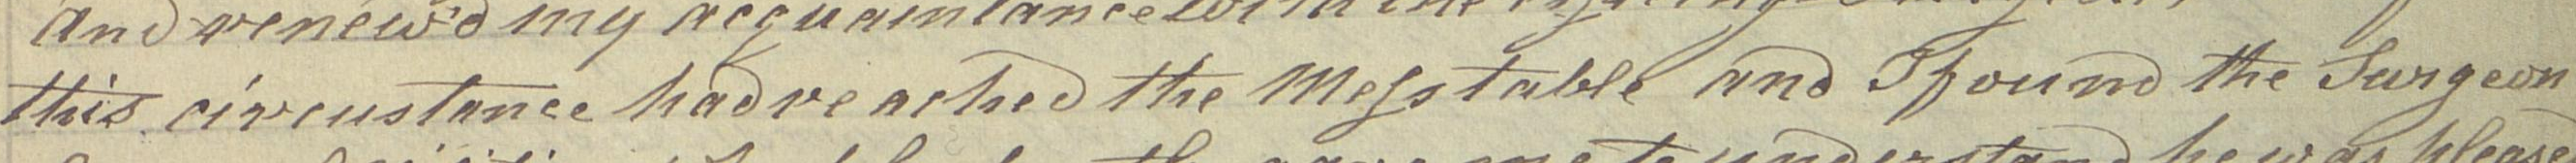this circustance had reached the Mess table and I Found the Surgeon
